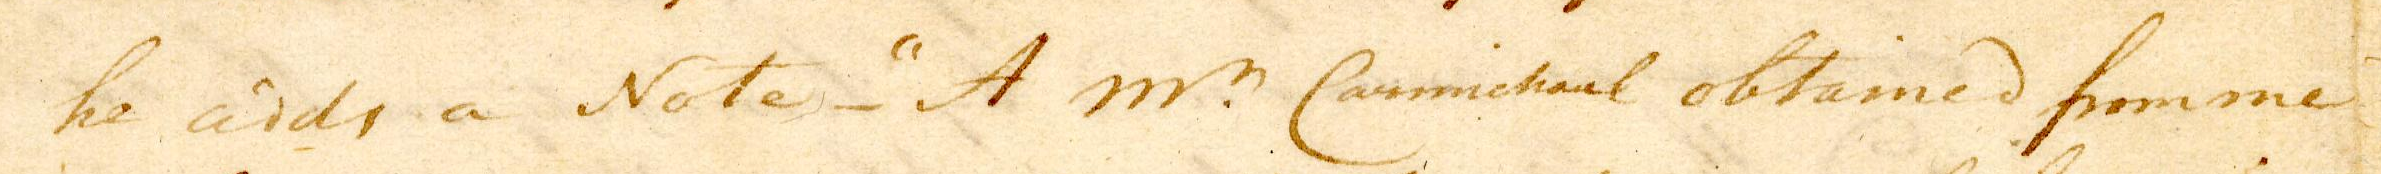he adds a Note.- "A M^r. Carmichael obtained from me
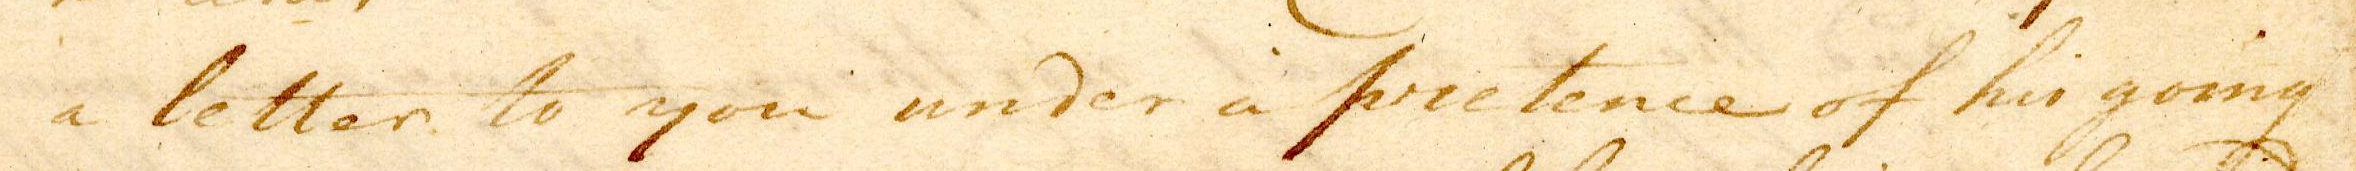a letter to you under a pretence of his going
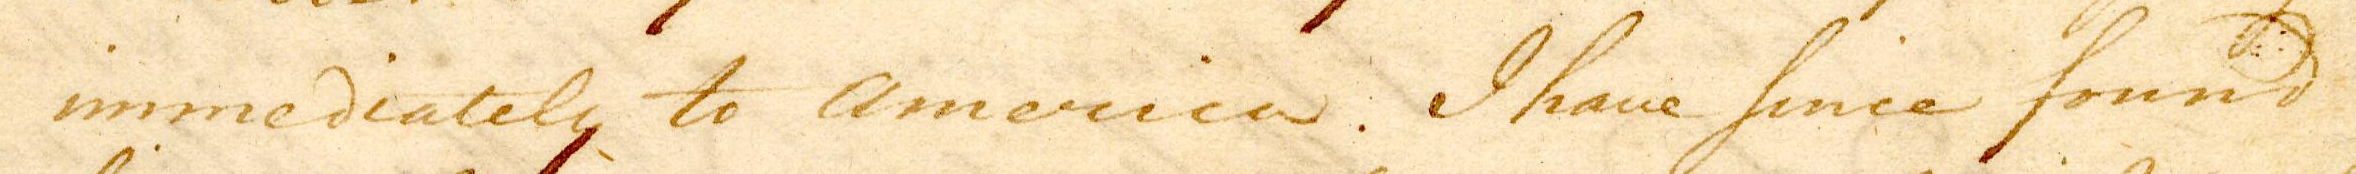immediately to America, I have since found
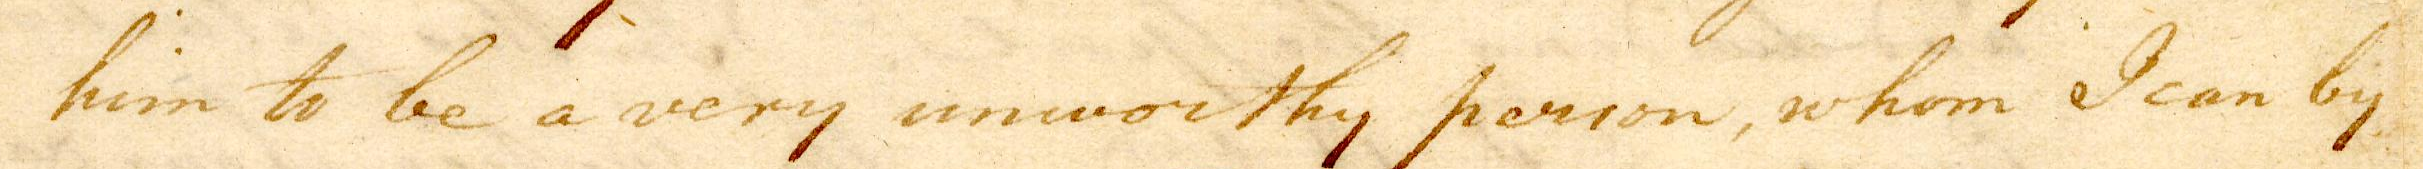him to be a very unworthy person, whom I can by
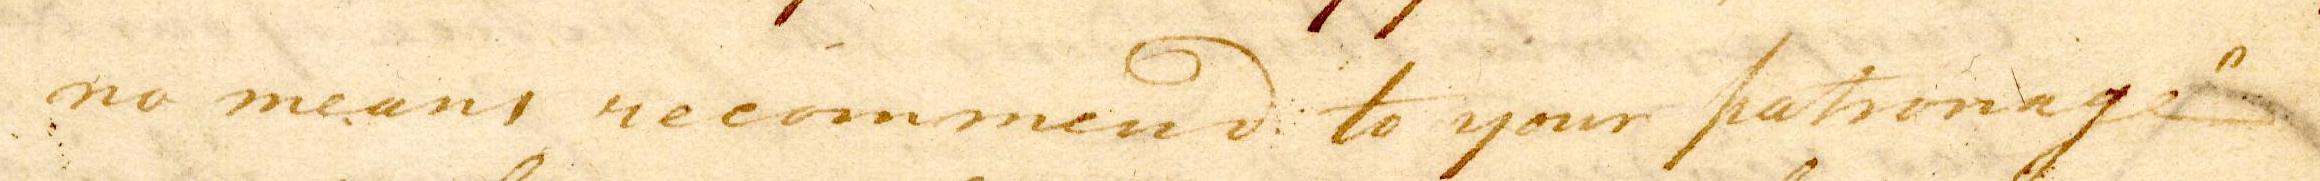no means recommend to your patronage &
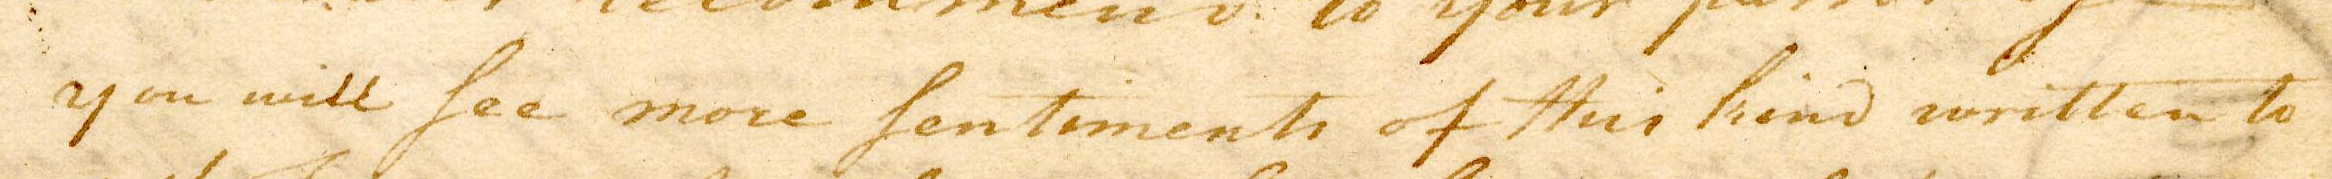you will see more sentiments of this kind written to
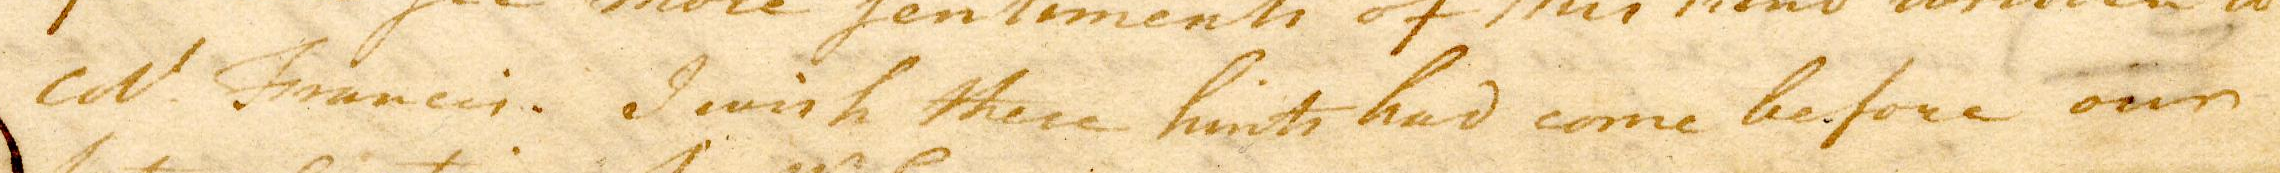col^l. Frances. I wish these hints had come before our
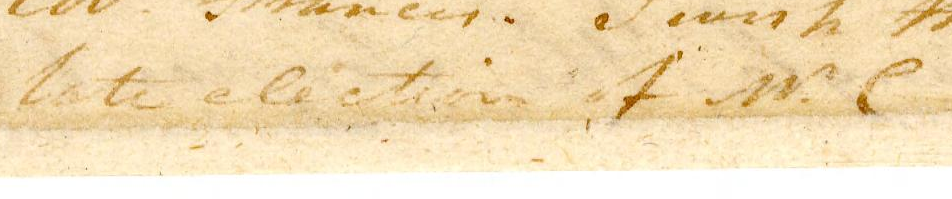late election of M^r. C
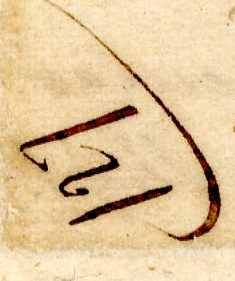121
